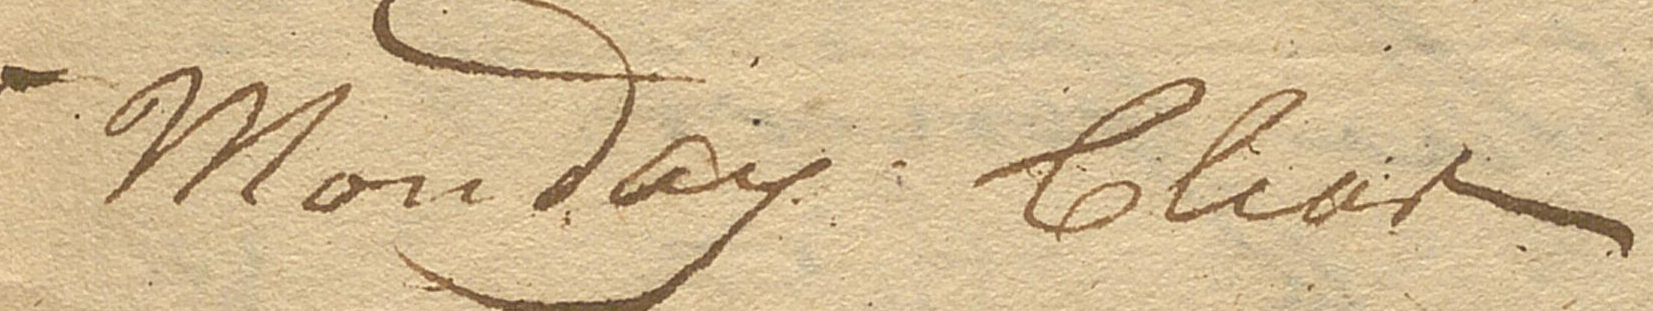Monday Clear
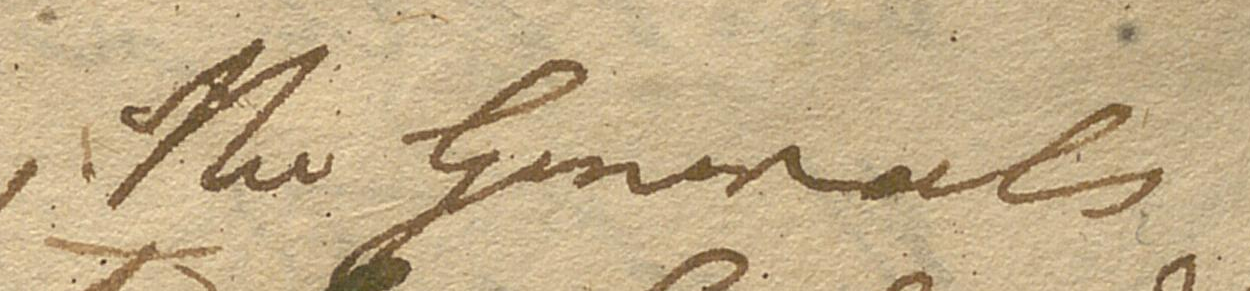the Generals
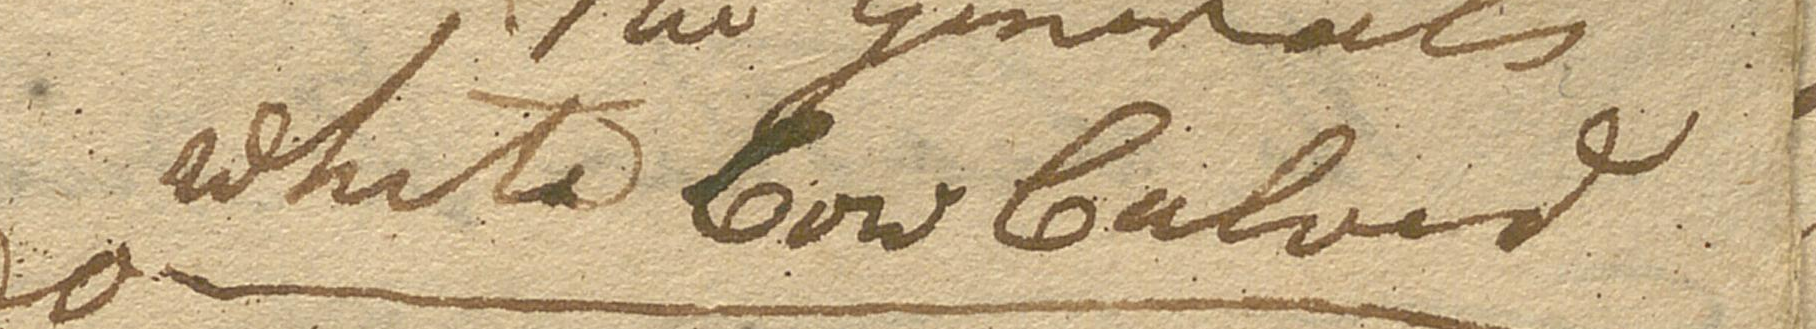white Cow Calved
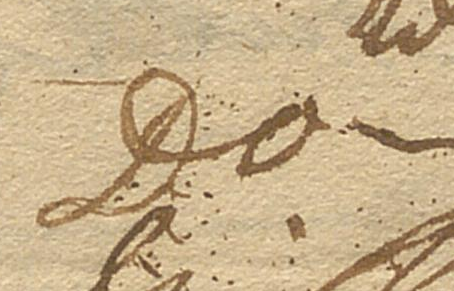D^o
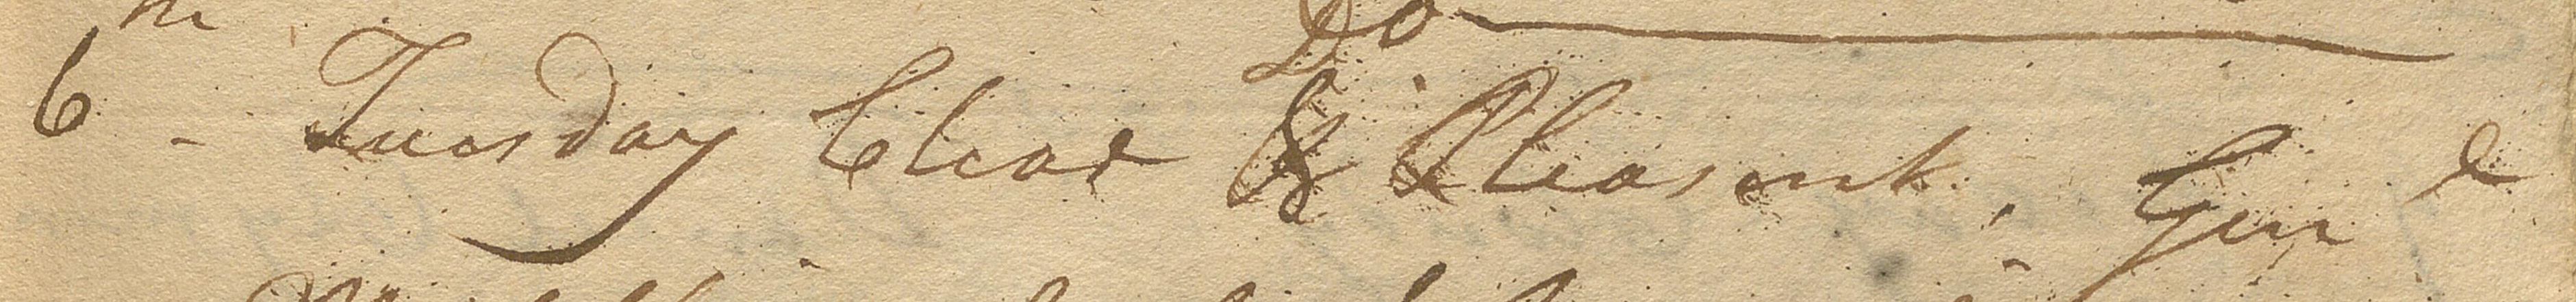6^th Tuesday Clear & Pleasent, Gen^l
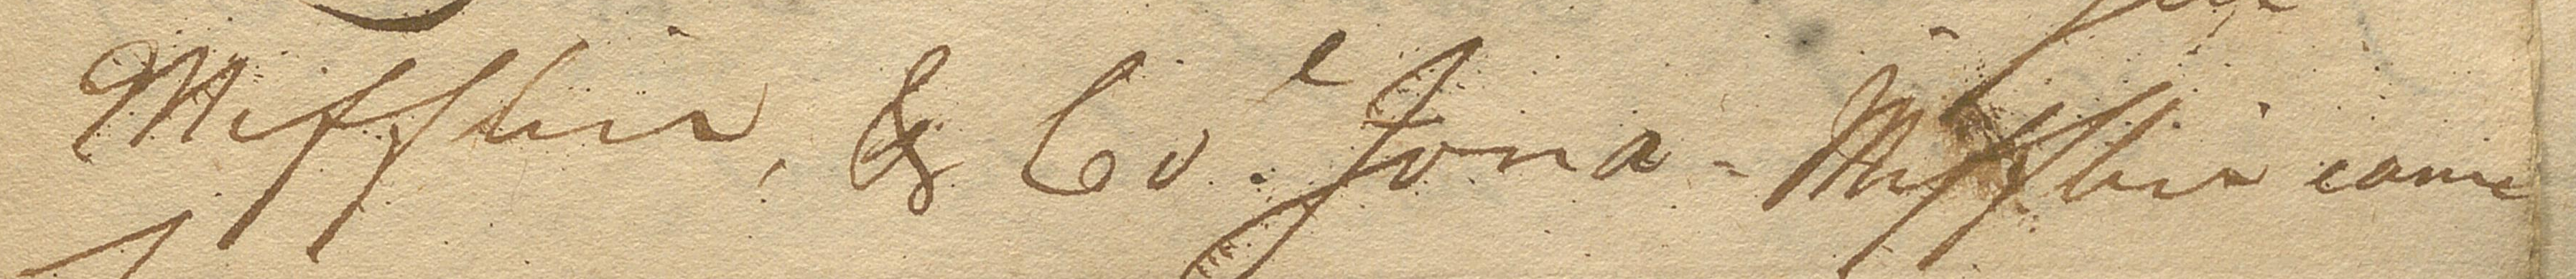Mifflin, & Co^l. Jona. Mifflin came
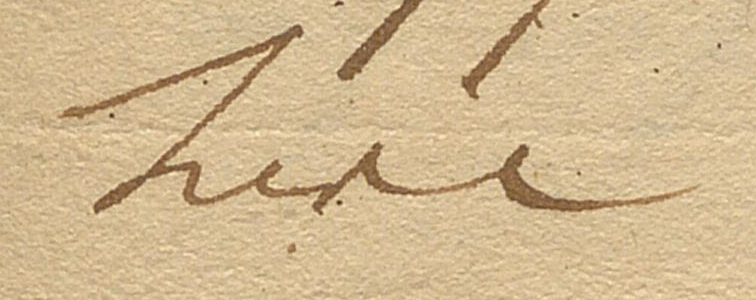here
